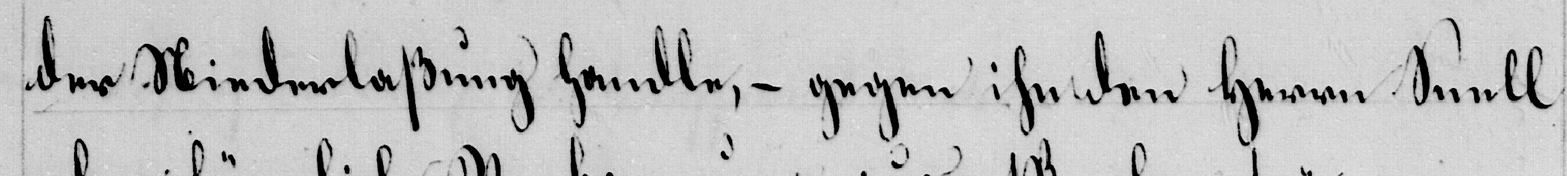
der Niederlaßung handle, – gegen ihn den Herrn Snell
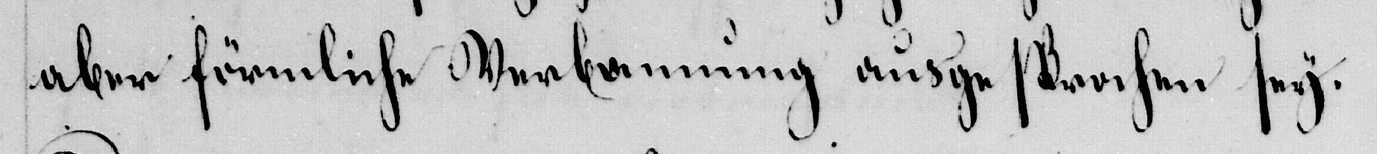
aber förmliche Verbannung ausgesprochen sey.
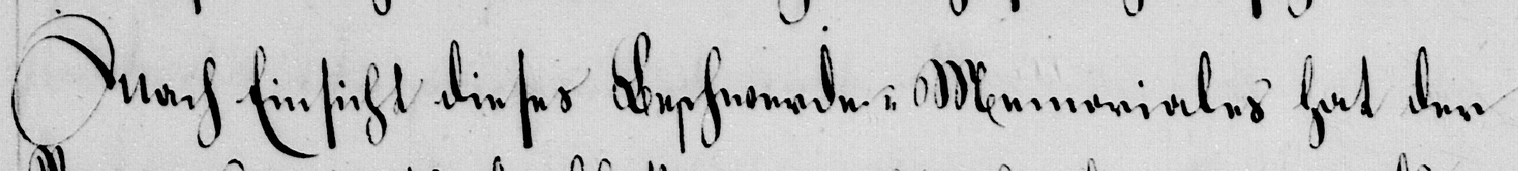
Nach Einsicht dieses Beschwerde-Memorials hat der
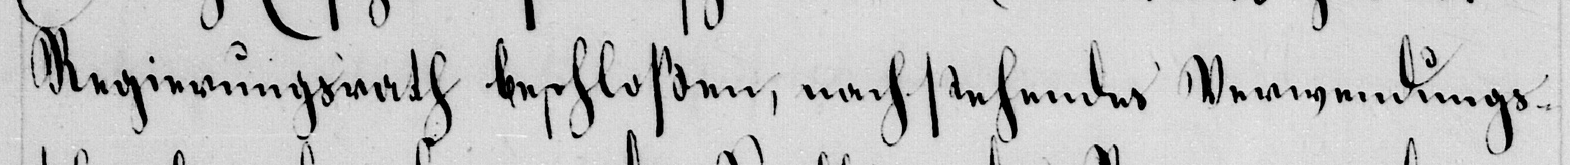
Regierungsrath beschloßen, nachstehenden Verwendungs¬
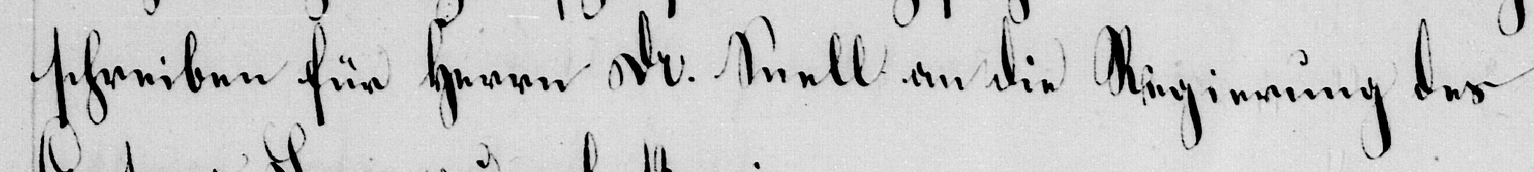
schreiben für Herrn Dr. Snell an die Regierung des
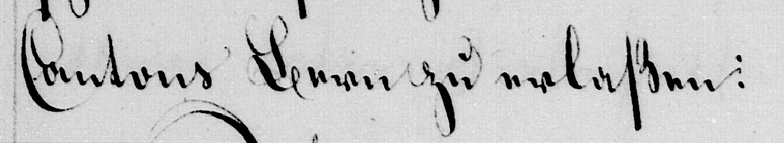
Cantons Bern zu erlaßen:
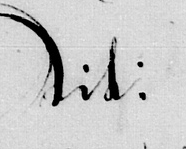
Tit:
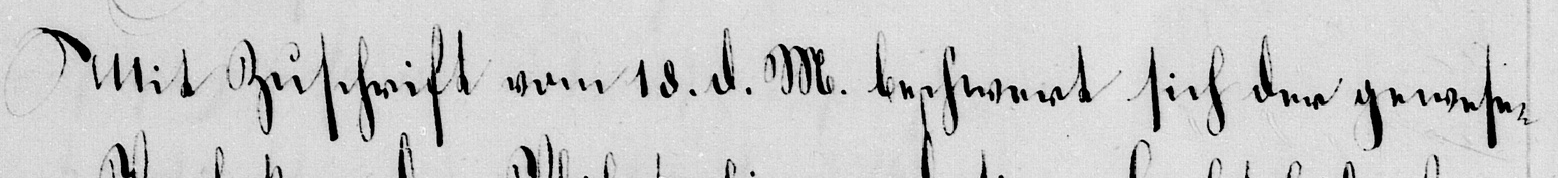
Mit Zuschrift vom 18. d. M. beschwert sich der gewese¬
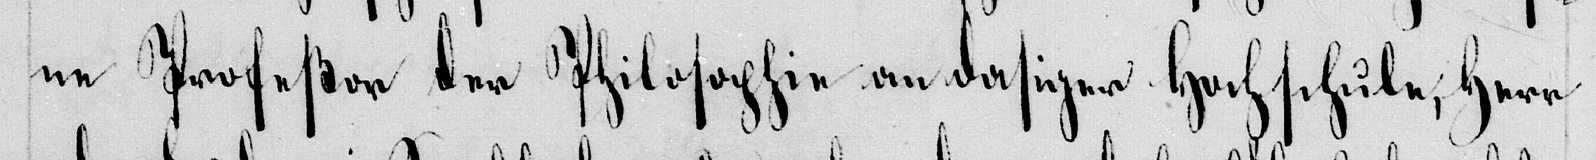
ne Profeßor der Philosophie an dasiger Hochschule, Herr
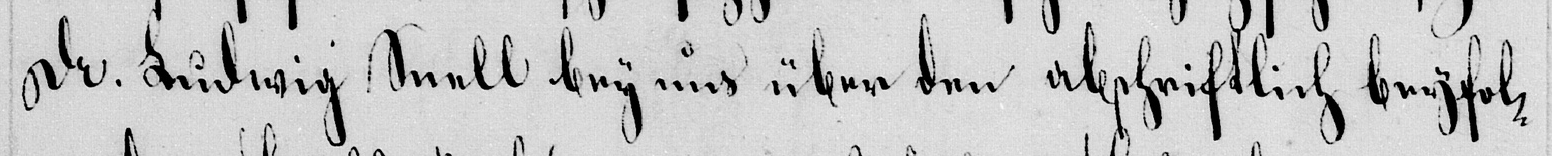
Dr. Ludwig Snell bey uns über den abschriftlich beyfol¬
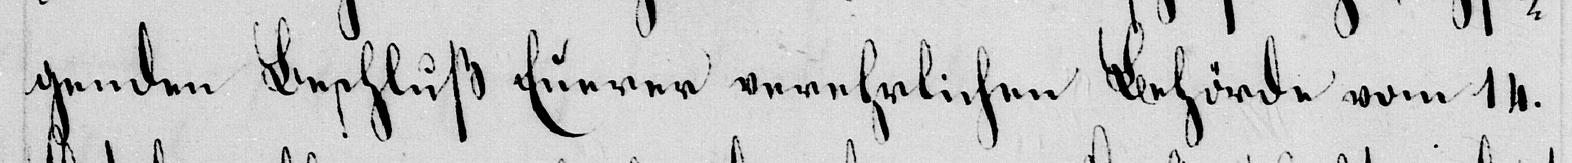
genden Beschluß Eurer verehrlichen Behörde vom 14.
